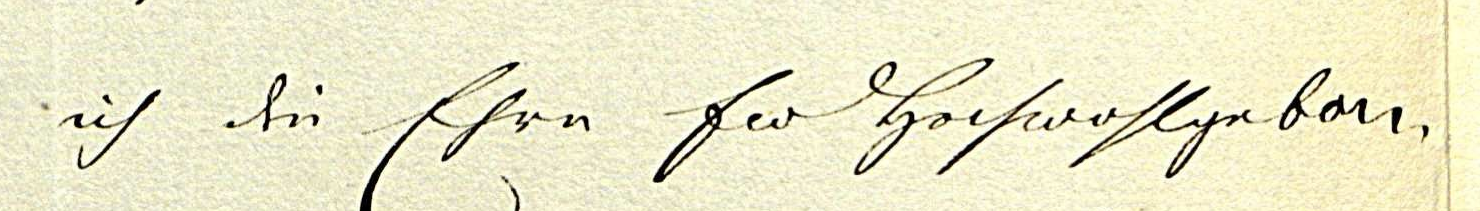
ich die Ehre Ew. Hochwohlgeboren
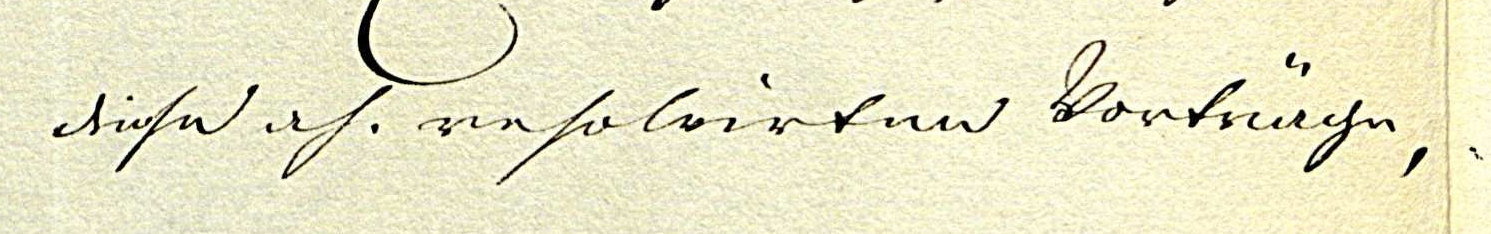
diese ah. resolvirten Vorträge,
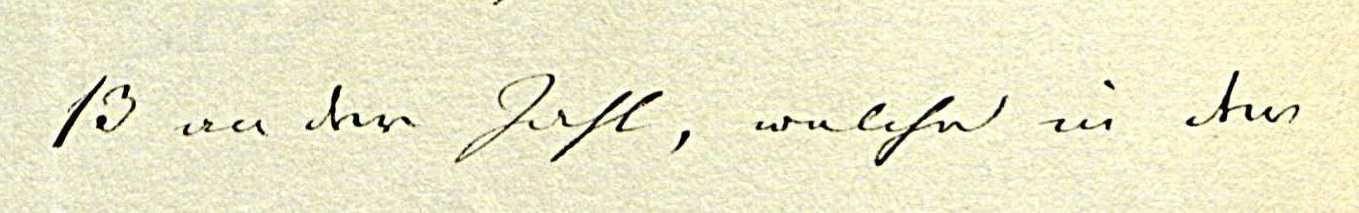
13 an der Zahl, welche in der
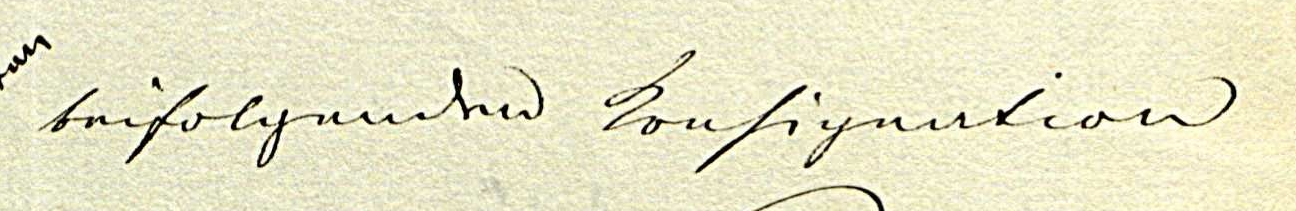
beifolgenden Konfiguration
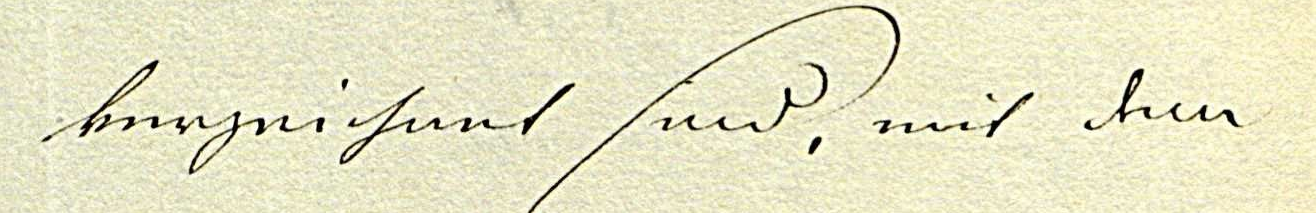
verzeichnet sin, mit em
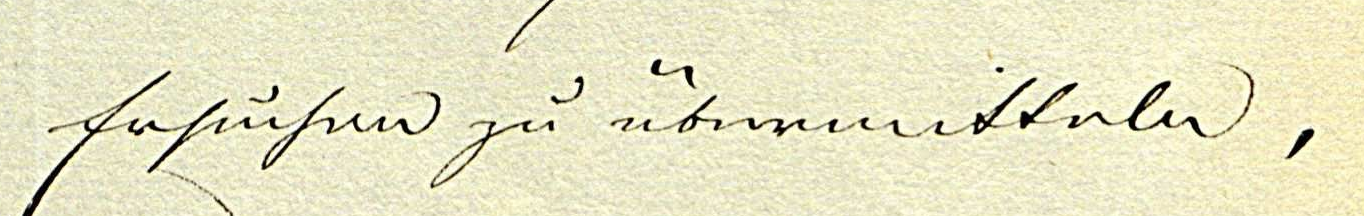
Ersuchen zu übermitteln,
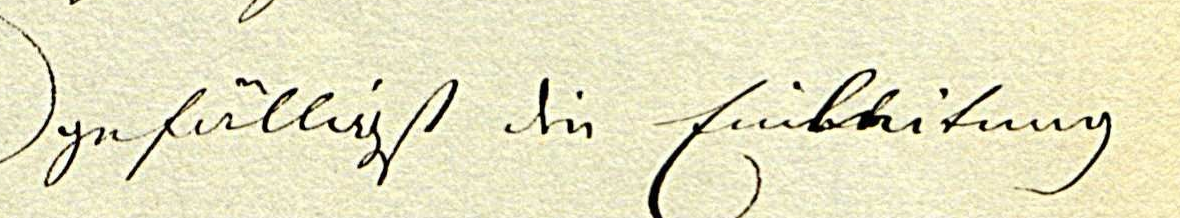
gefälligst die Einleitung
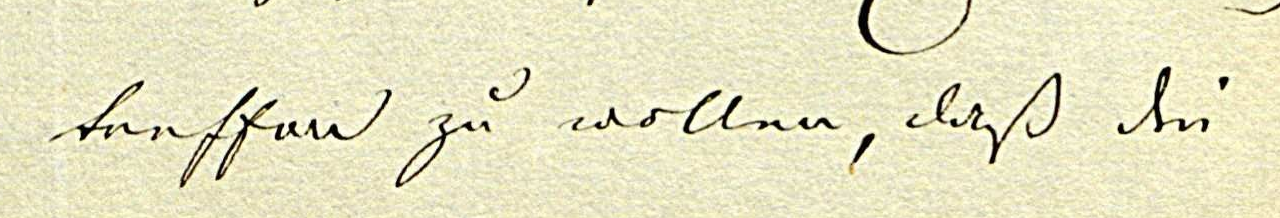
treffen zu wollen, daß die
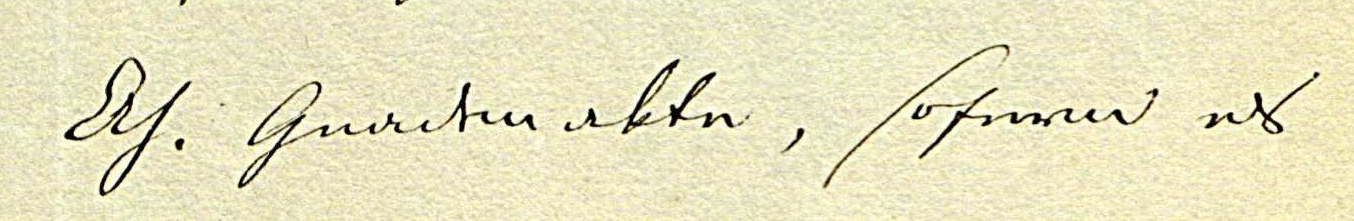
Ah. Gnadenakte, soferne es
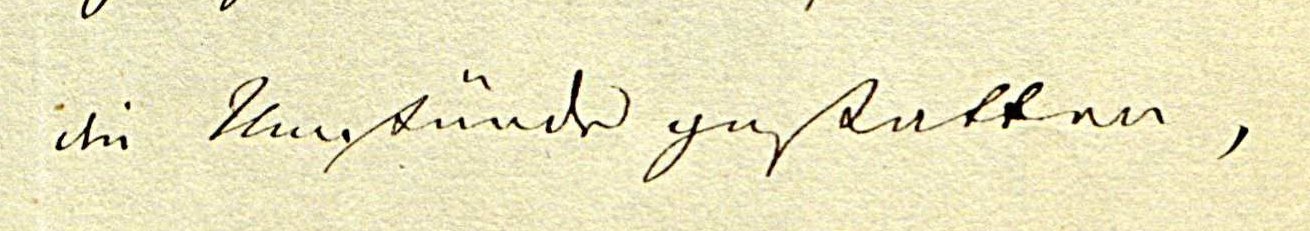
die Umstände gestatten,
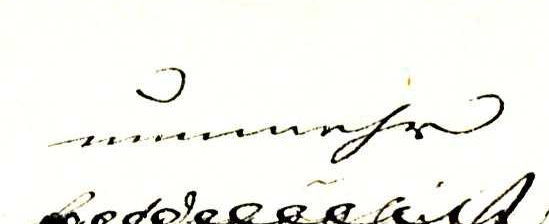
Nunmehr
